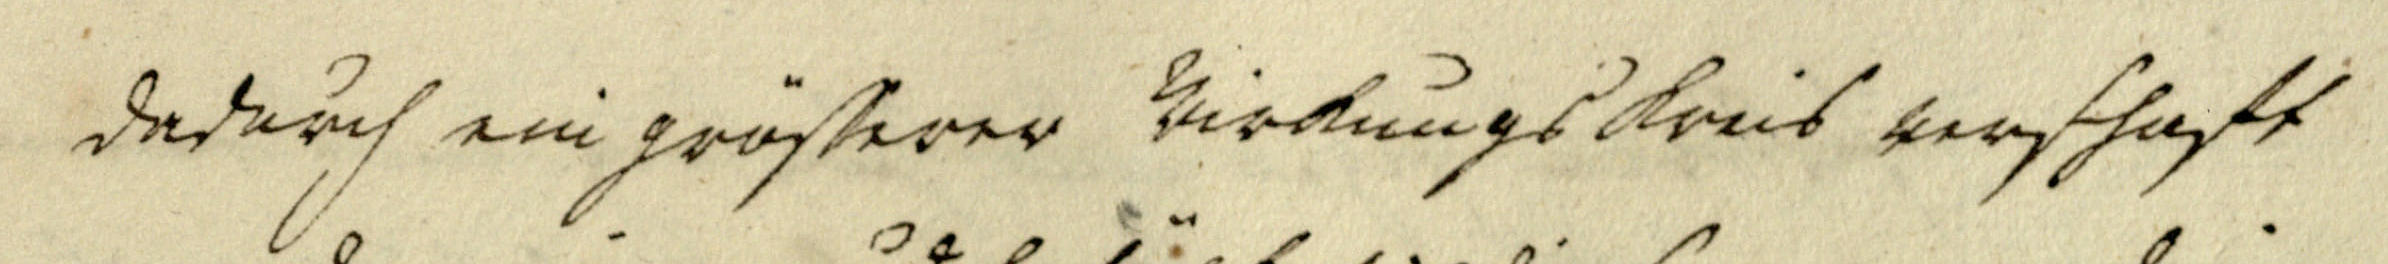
dadurch ein grösserer Wirkungs Kreis verschaft
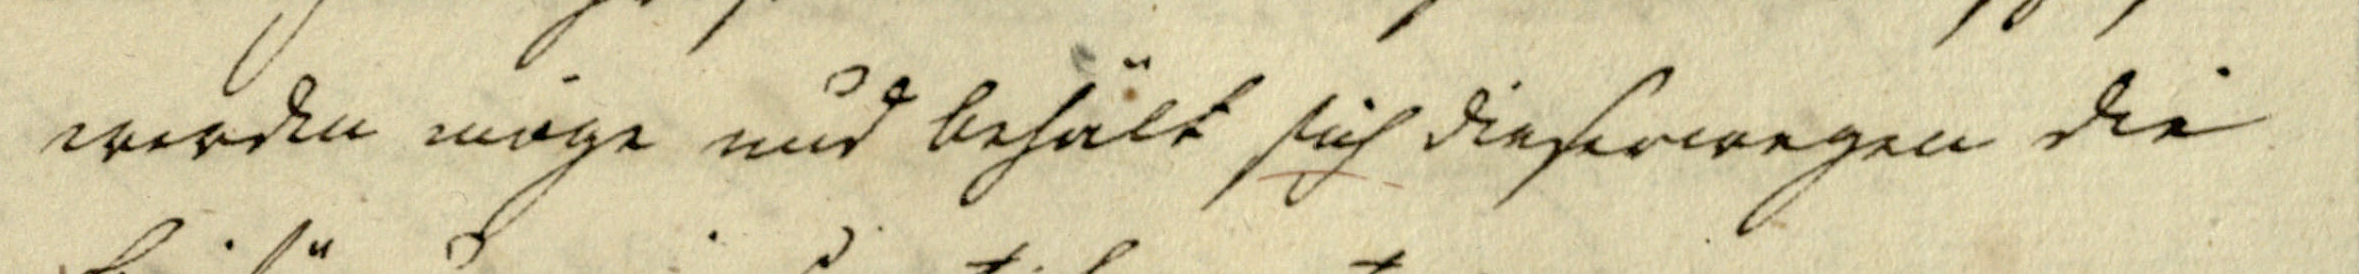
werden möge und behält sich dieserwegen die
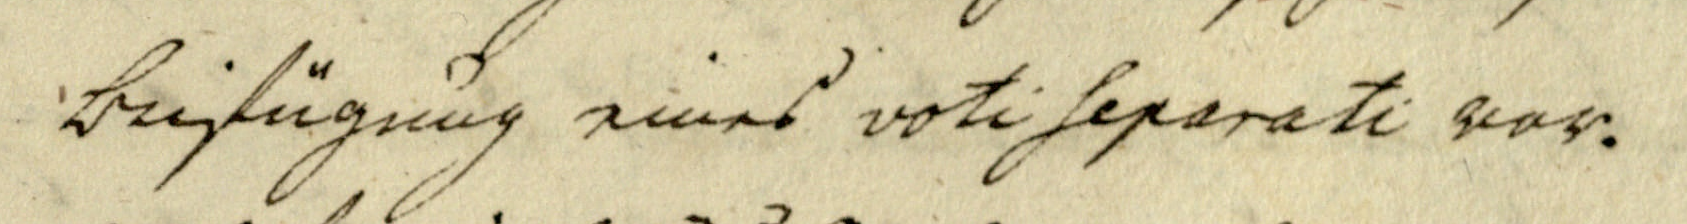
Beifügung eines voti separati vor.
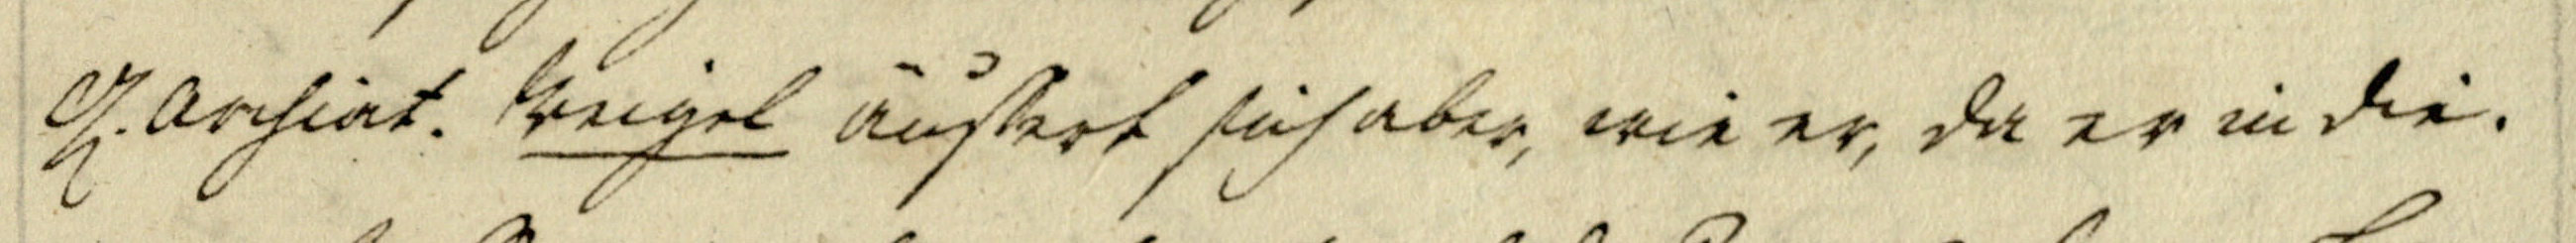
dh. Archiat. Weigel äussert sich aber, wie er, da er in die¬
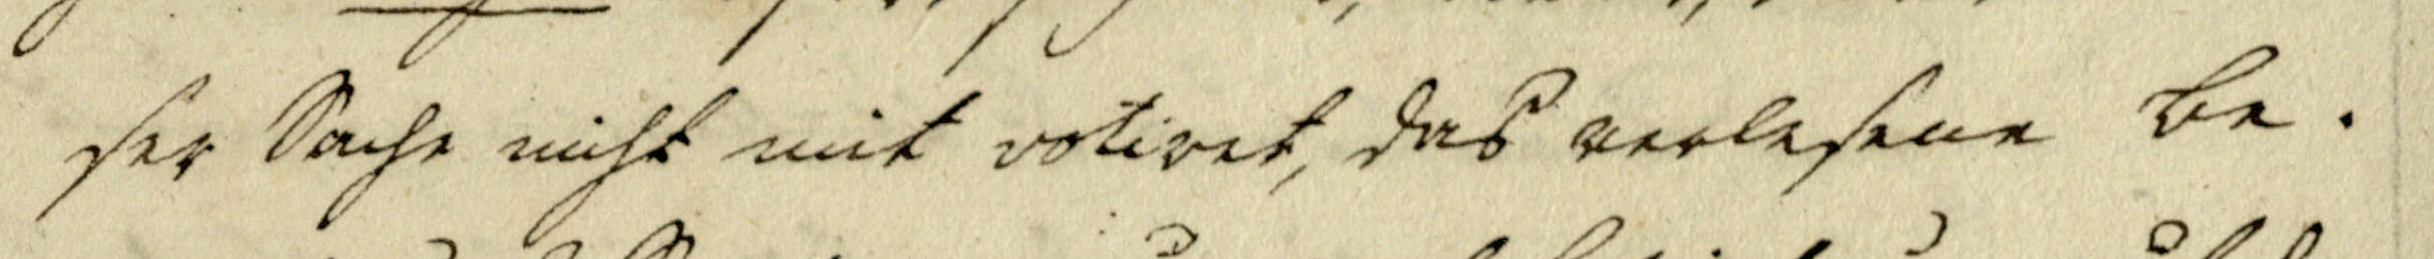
ser Sache nicht mit votiret, das verlesene Be¬
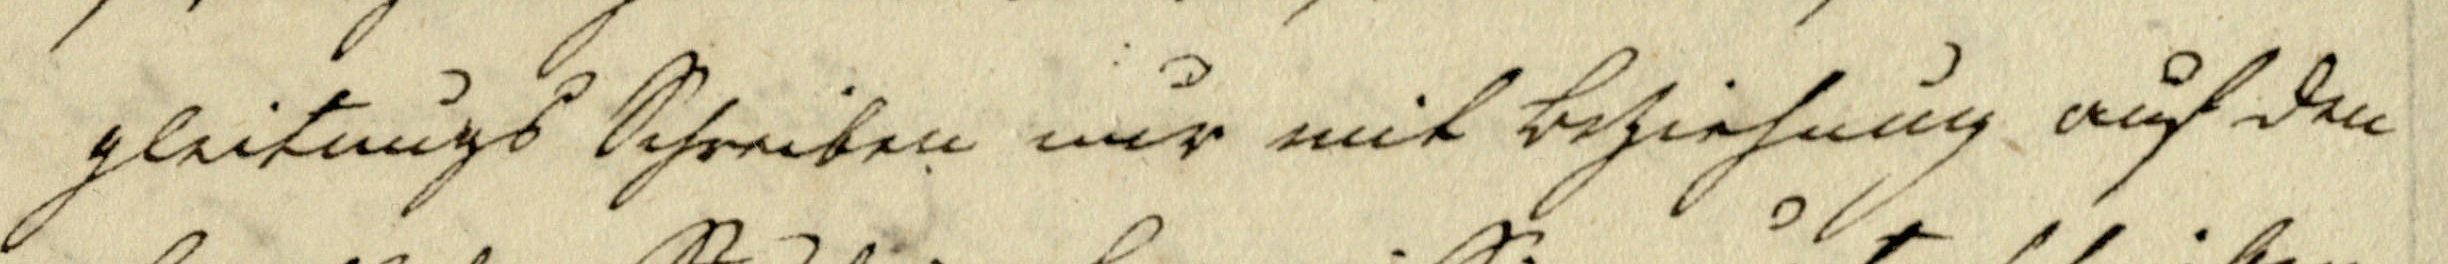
gleitungs Schreiben nur mit Beziehung auf den
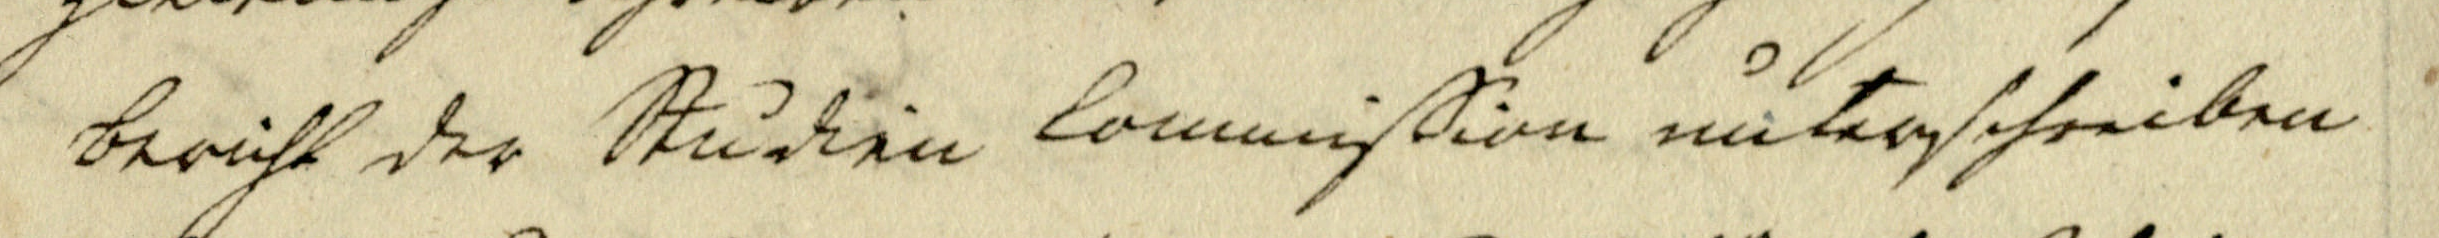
Bericht der Studien Commission unterschreiben
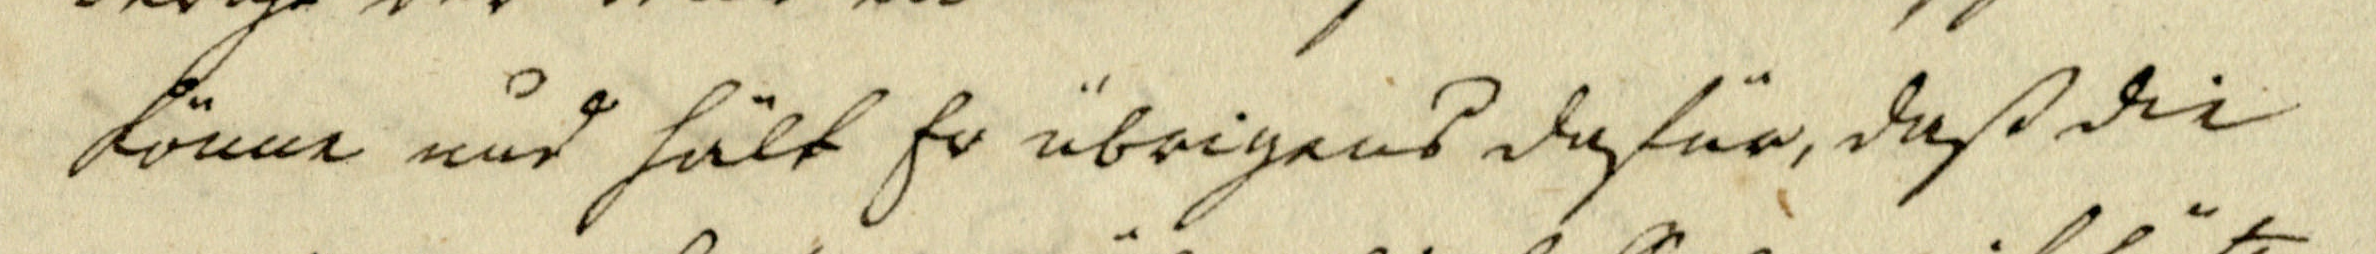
könne und hält Er übrigens dafür, daß die
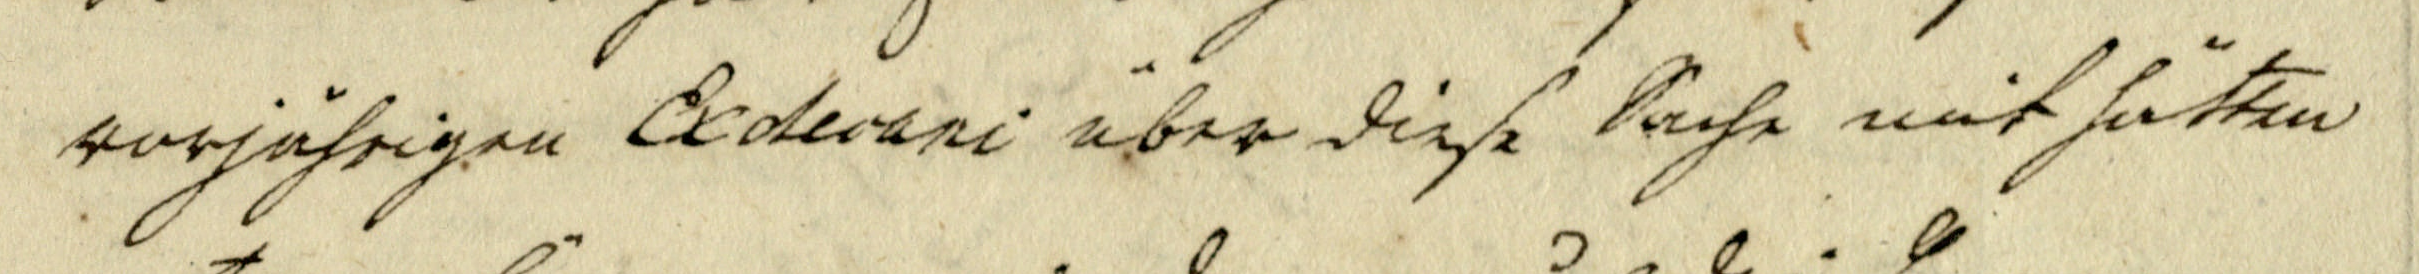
vorjährigen Exdecani über diese Sache mit hätten
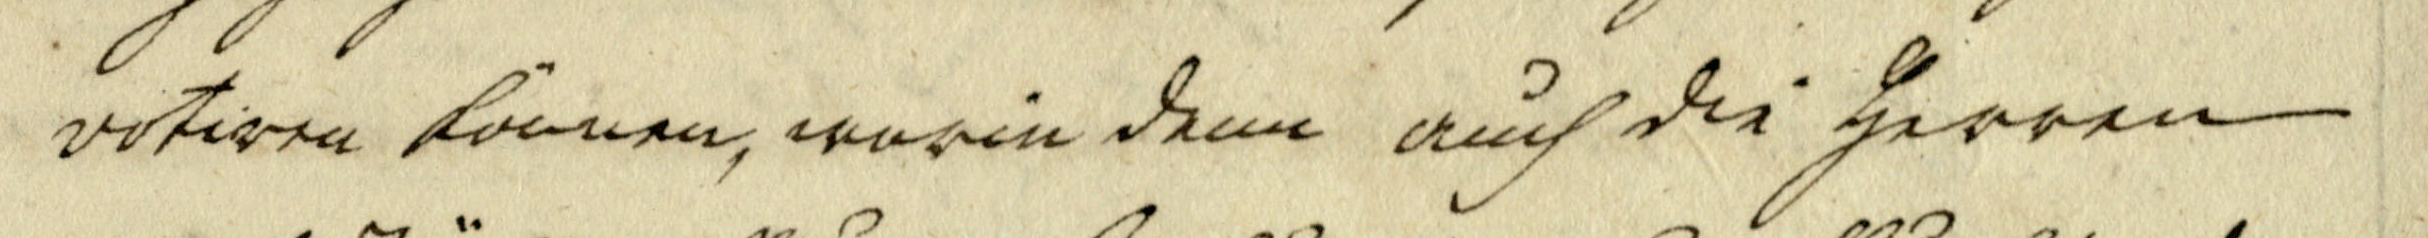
votiren können, worin denn auch die Herren
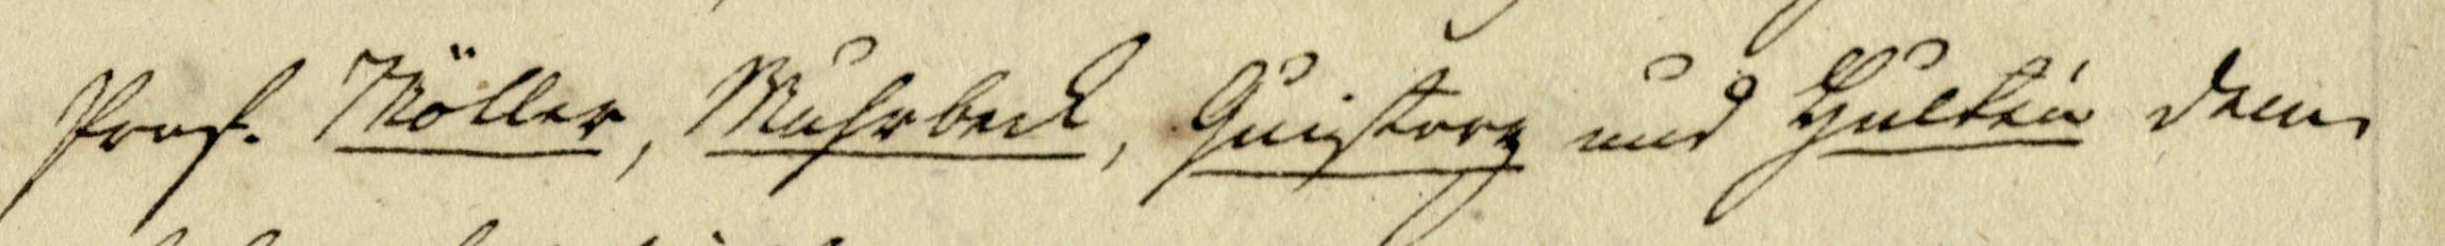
Prof. Möller, Muhrbeck, Quistorp und Hultén dem
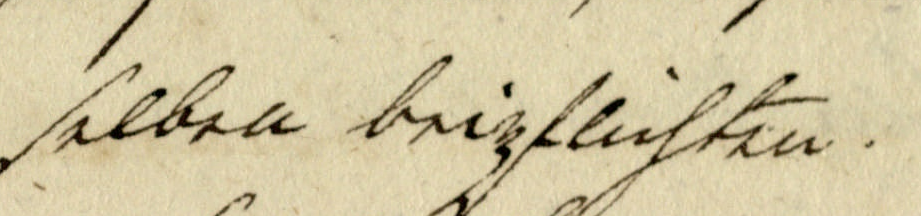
selben beipflichten.
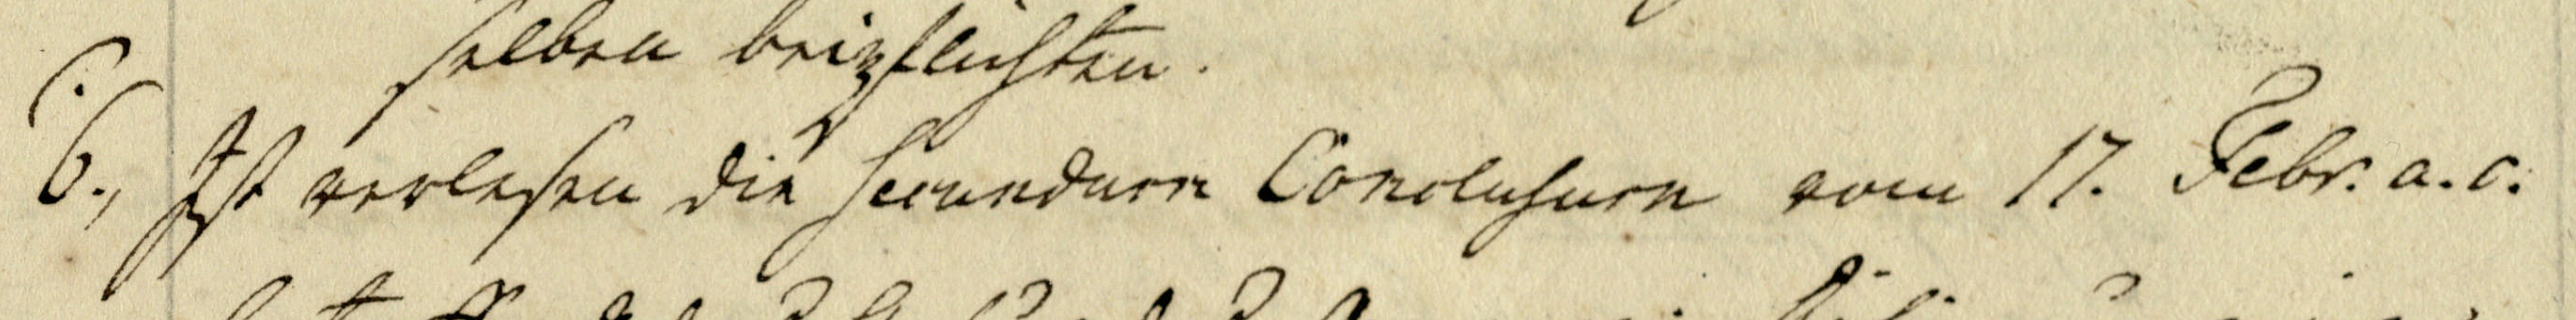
6., Ist verlesen die secundum Conclusum vom 17. Febr. a. c.
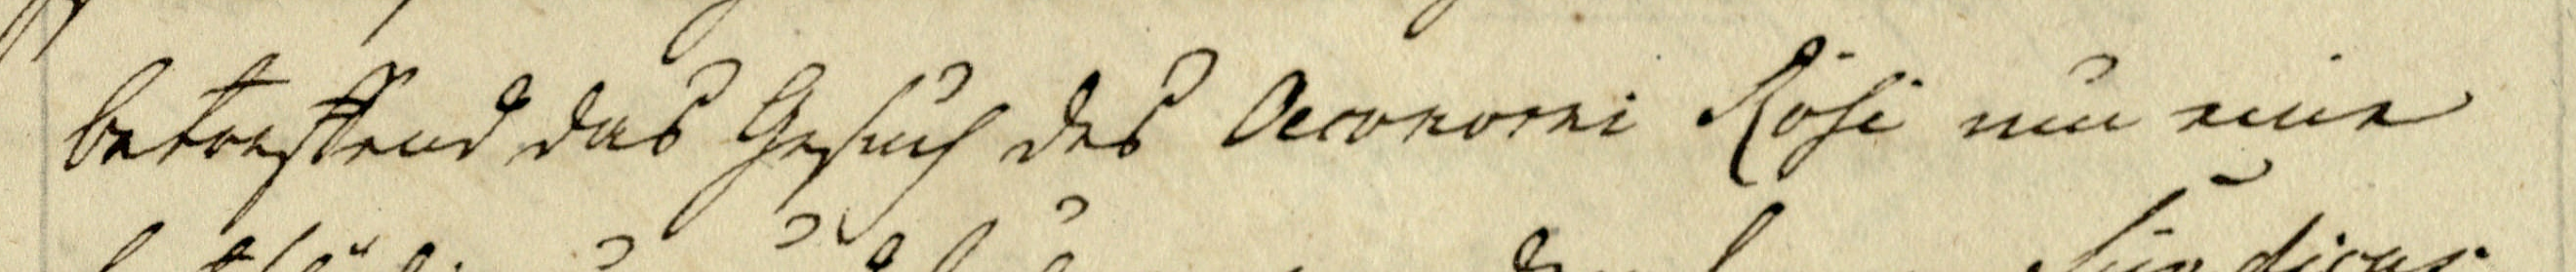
betreffend das Gesuch des Oeconomi Röse um eine
